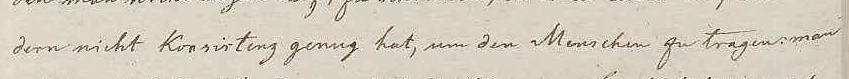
dern nicht Konsistenz genug hat, um den Menschen zu tragen: man
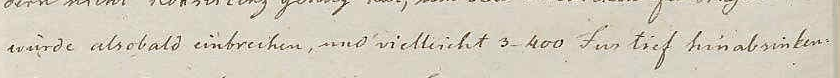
würde alsobald einbrechen, und vielleicht 3–400 Fus tief hinabsinken.
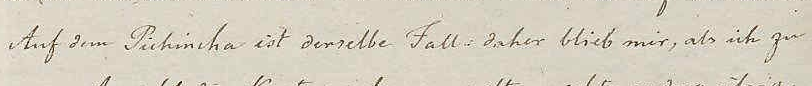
Auf dem Pichincha ist derselbe Fall: daher blieb mir, als ich zu
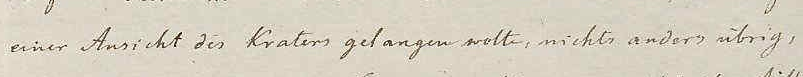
einer Ansicht des Kraters gelangen wolte, nichts anders übrig,
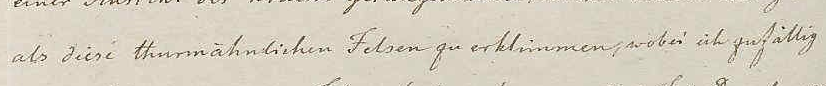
als diese thurmähnlichen Felsen zu erklimmen, wobei ich zufällig
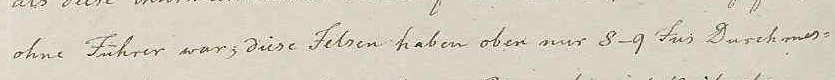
ohne Führer war, diese Felsen haben oben nur 8–9 Fus Durchmes-
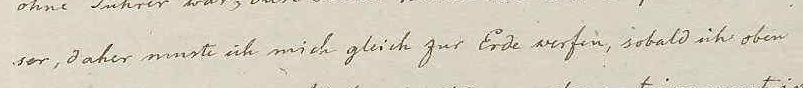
ser, daher muste ich mich gleich zur Erde werfen, sobald ich oben
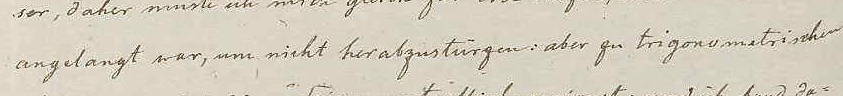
angelangt war, um nicht herabzustürzen: aber zu trigonometrischen
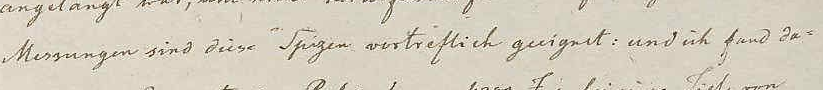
Messungen sind diese Spizen vortreflich geeignet: und ich fand da-
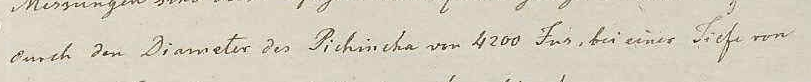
durch den Diameter des Pichincha von 4200 Fus, bei einer Tiefe von
